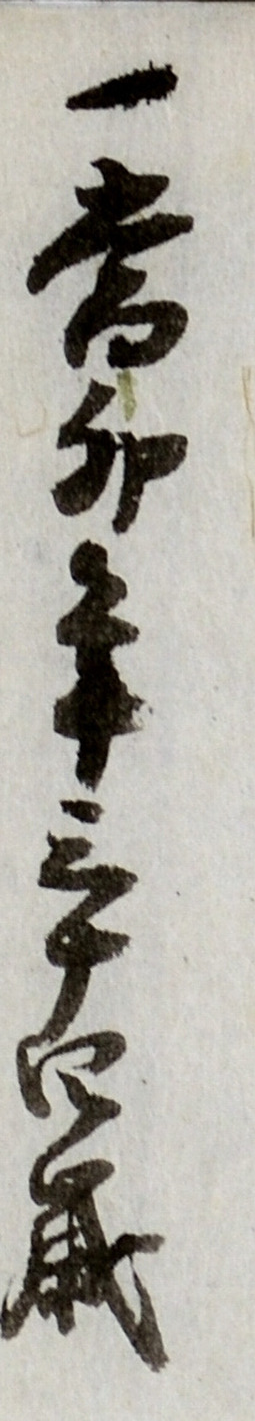一当卯年三十四歳
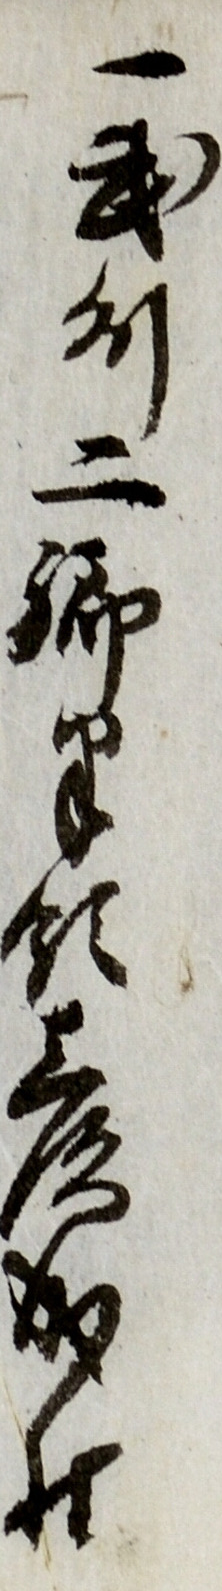一武州二郷半領彦成村
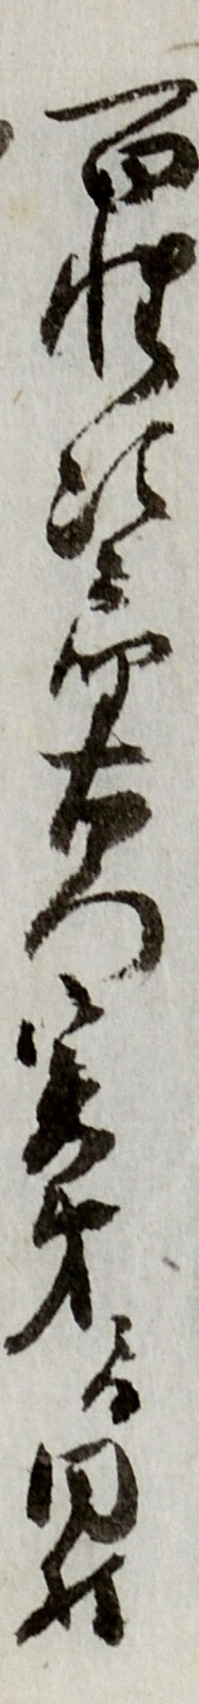百性次郎右衛門実弟にて同村
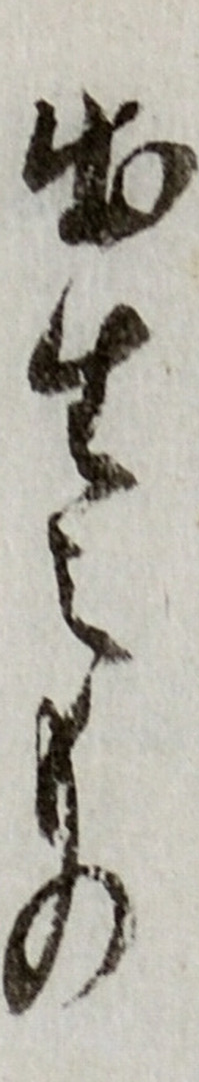出生之もの
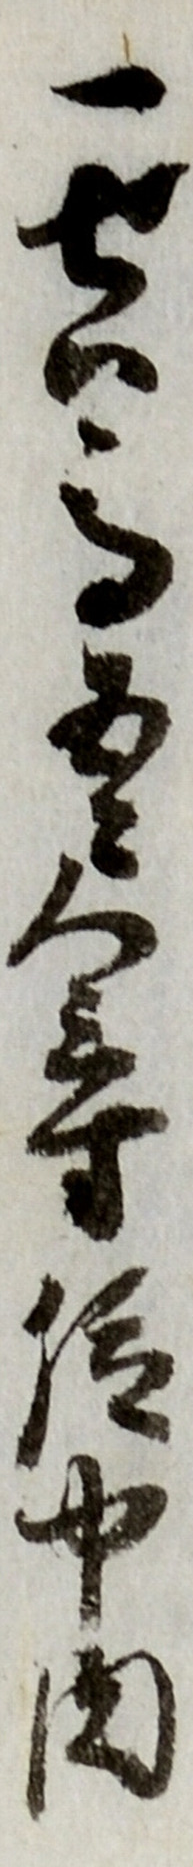一せい高五尺三寸位中肉
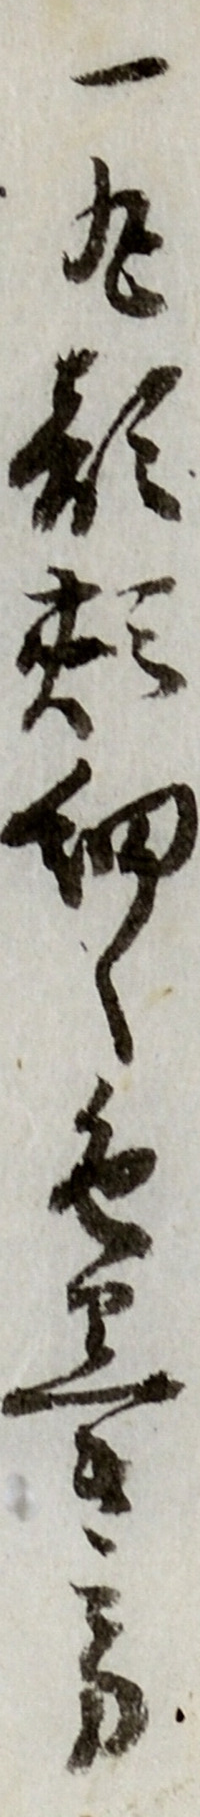一丸顔頬細く色黒き方
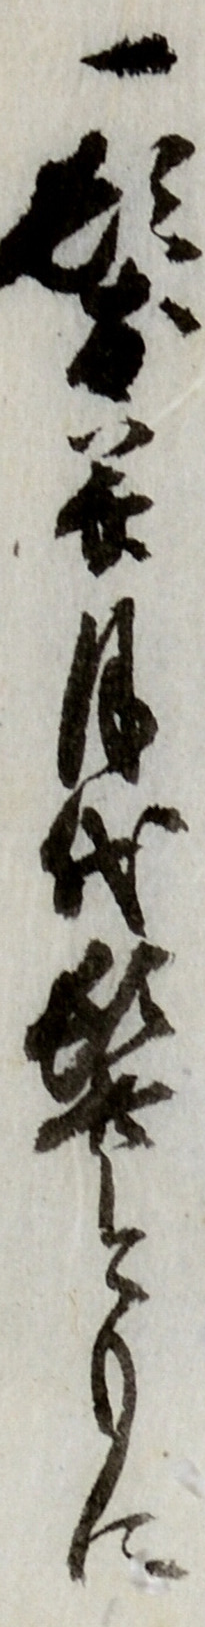一髪并月代髭ともに
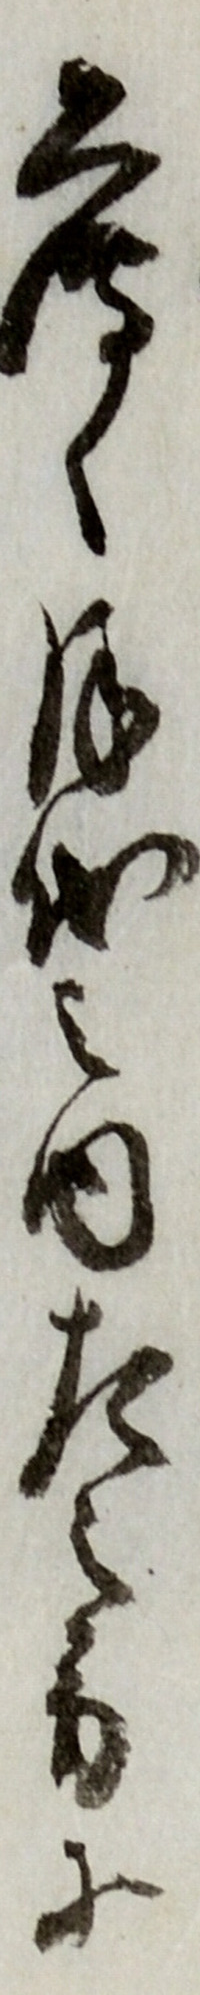薄く月代之内左之方に
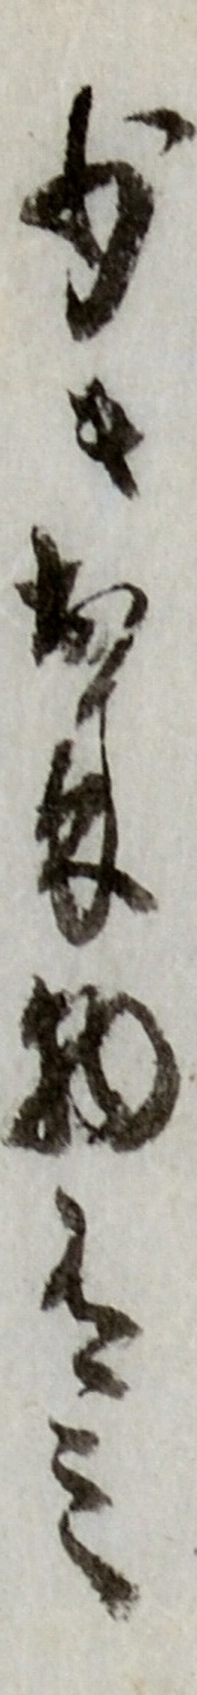少々出来物有之
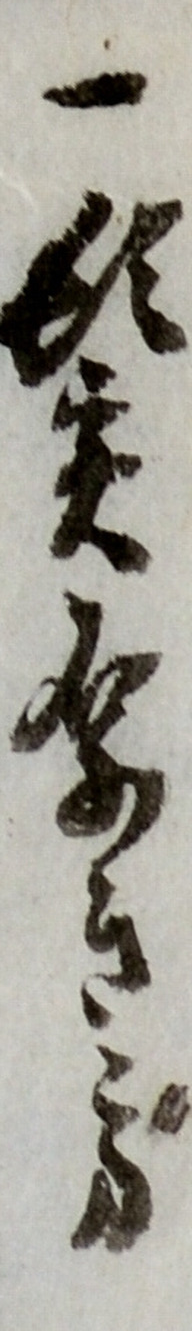一鬢厚き方
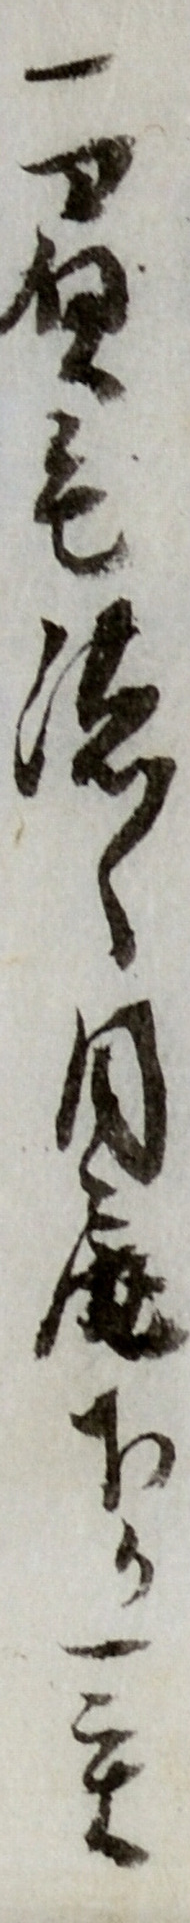一眉毛濃く目尻下り一重
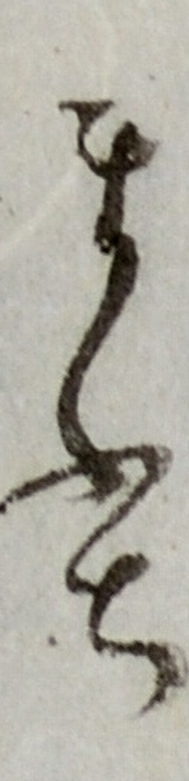まふち
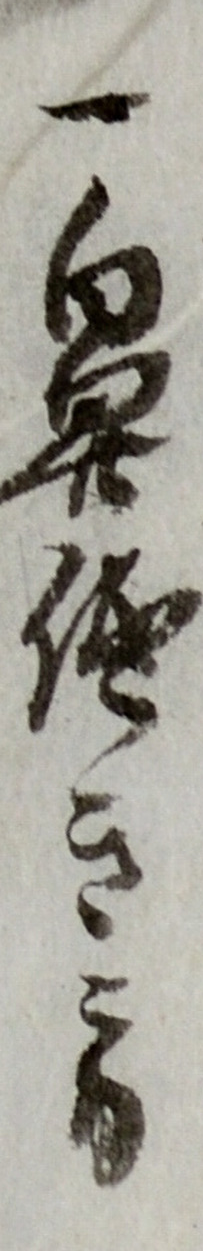一鼻低き方

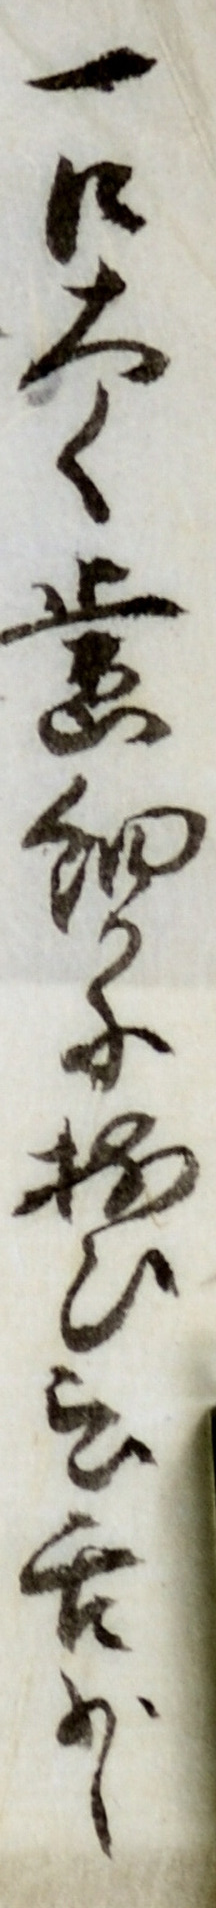一口大く歯細かに揃ひ言舌少し
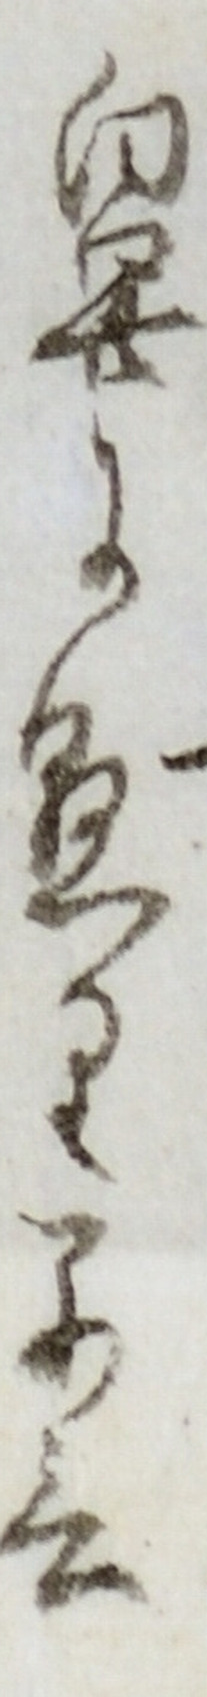鼻に懸り早言
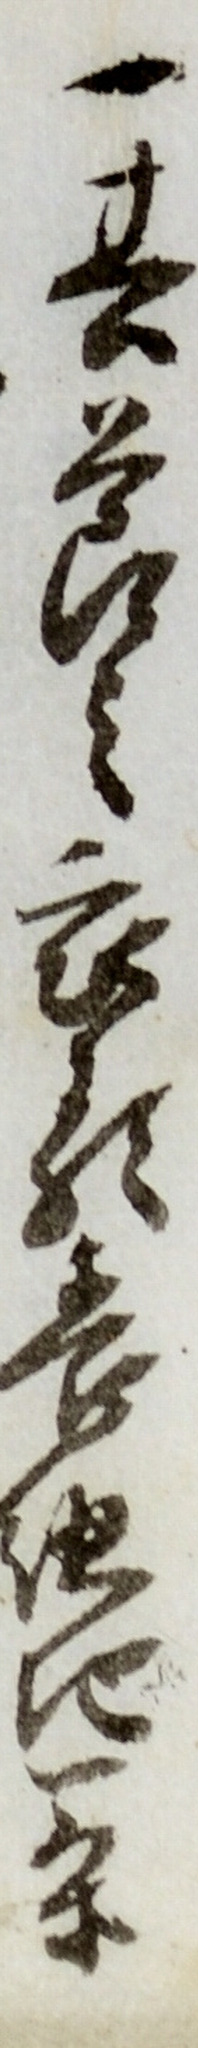一其節之衣類表紺地系
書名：諸事御用留帳
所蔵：伊那市立高遠町図書館・合同会社AMANE
